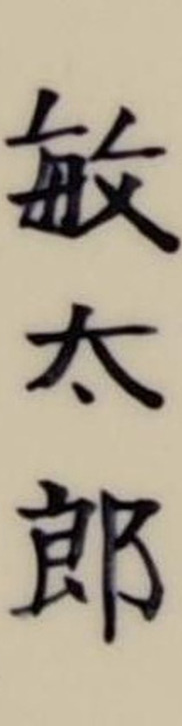敏太郎
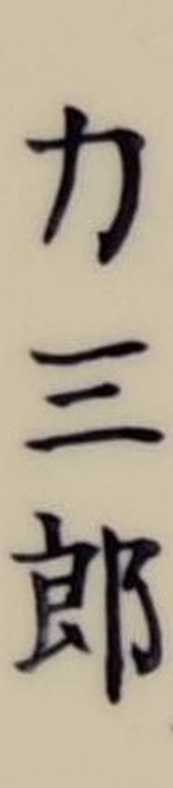力三郎
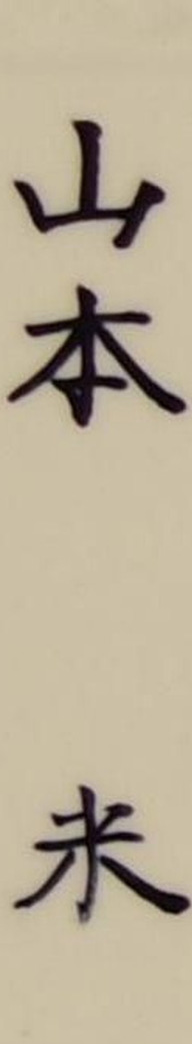山本米
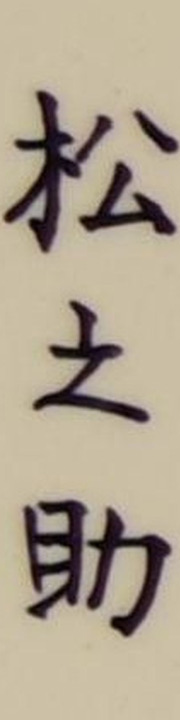松之助
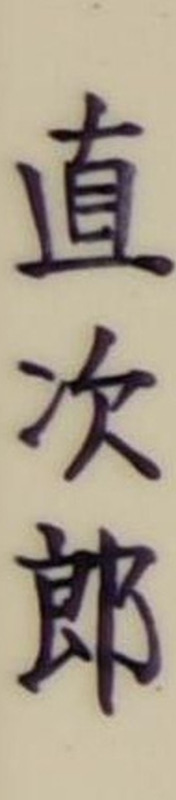直次郎

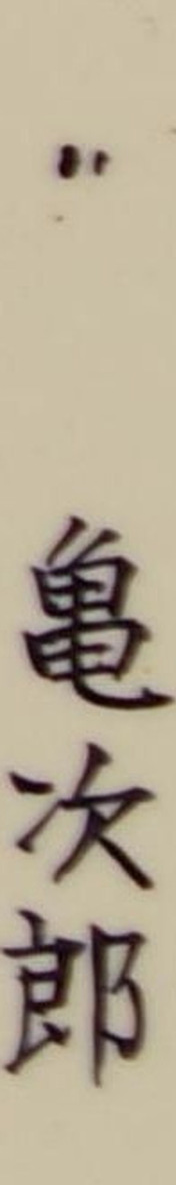亀次郎
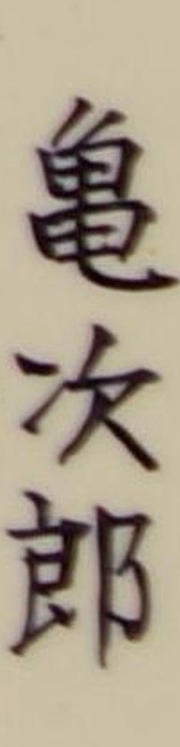亀次郎
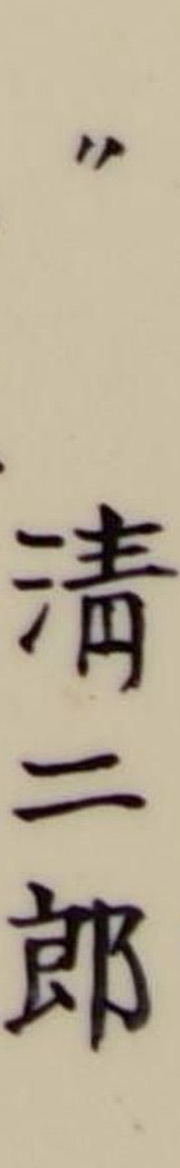清二郎
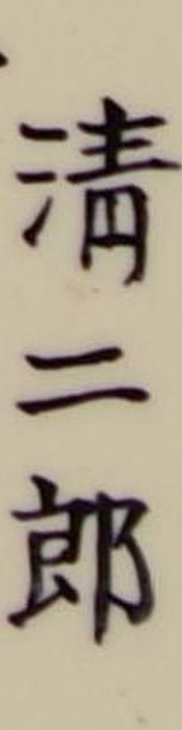清二郎
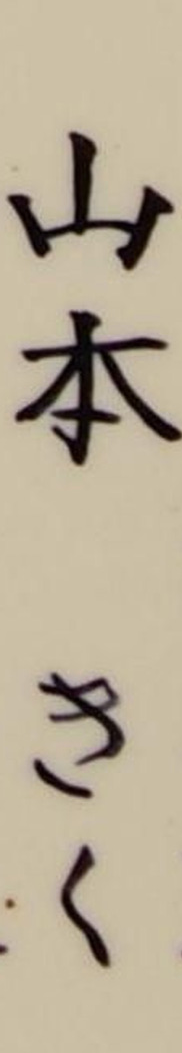山本きく
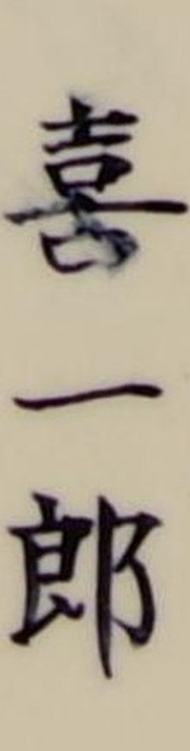喜一郎
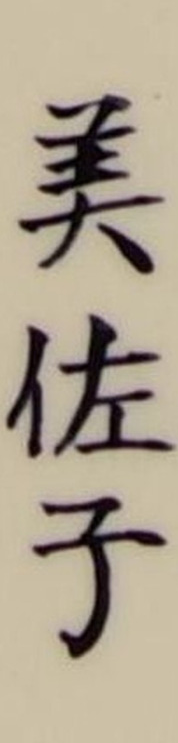美佐子
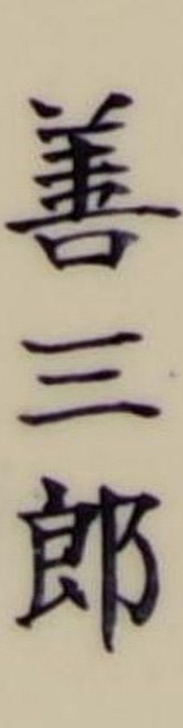善三郎
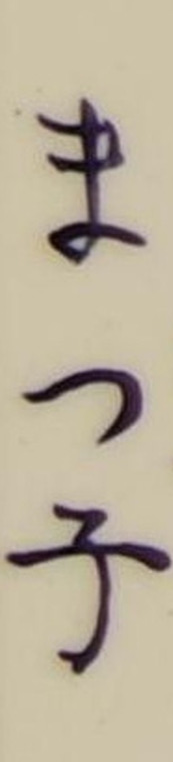まつ子

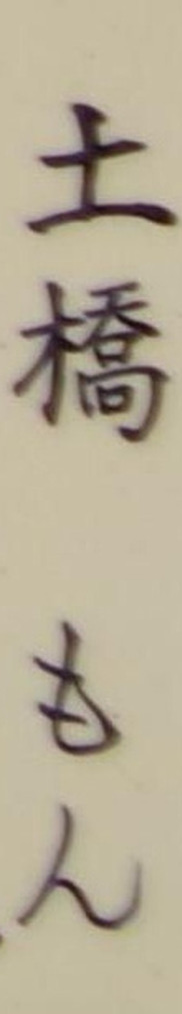土橋もん
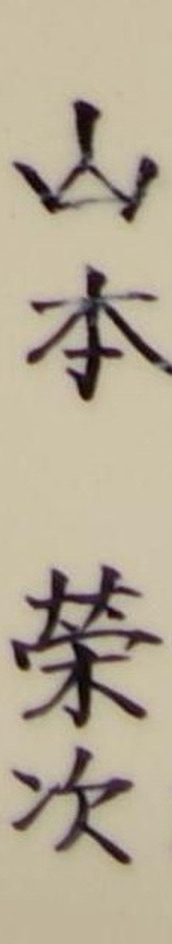山本榮次
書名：A~D
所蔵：koyasan kongobuji
